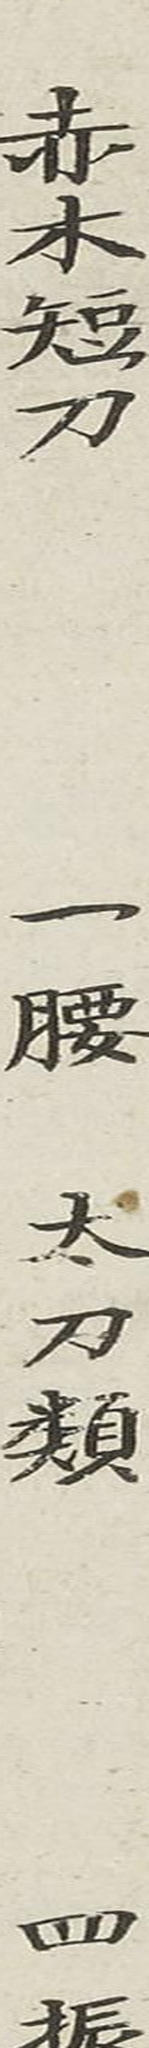赤木短刀一腰太刀類四振
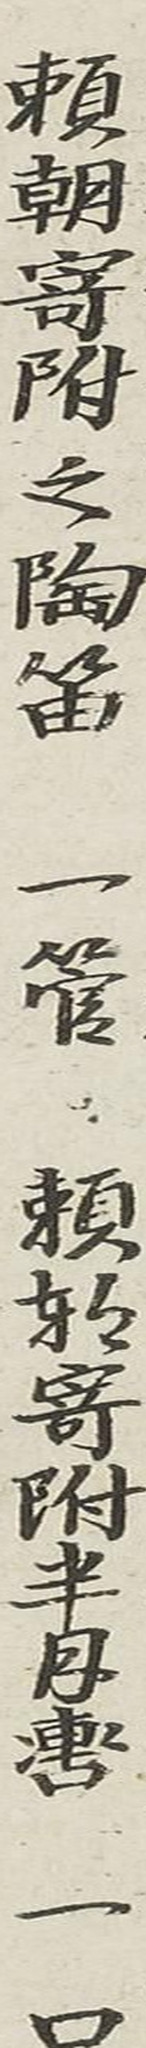頼朝寄附之陶笛一管頼朝寄附半月轡一口
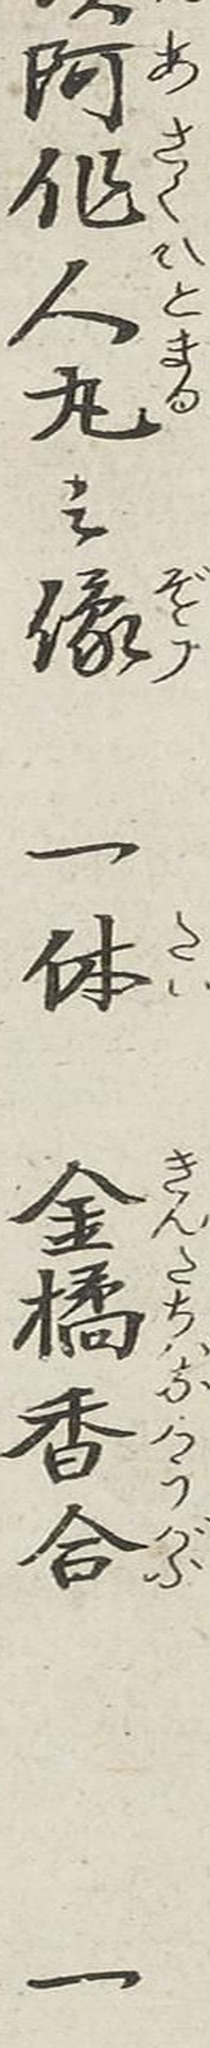頓阿作人丸之像一体金橘香合一個
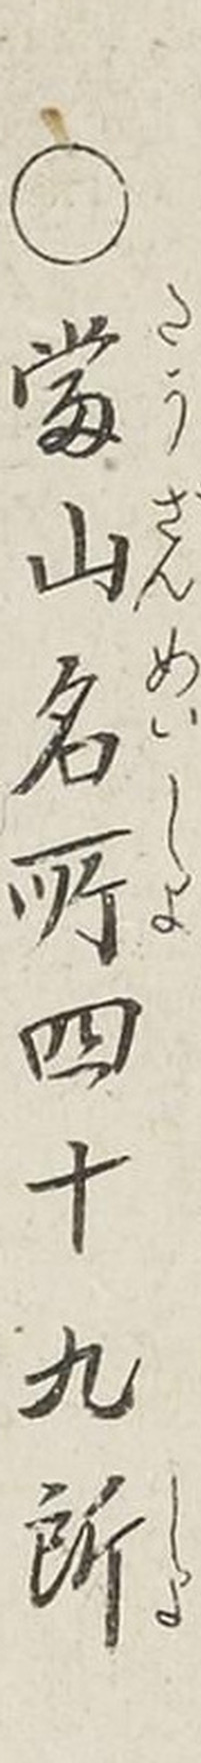○當山名所四十九所
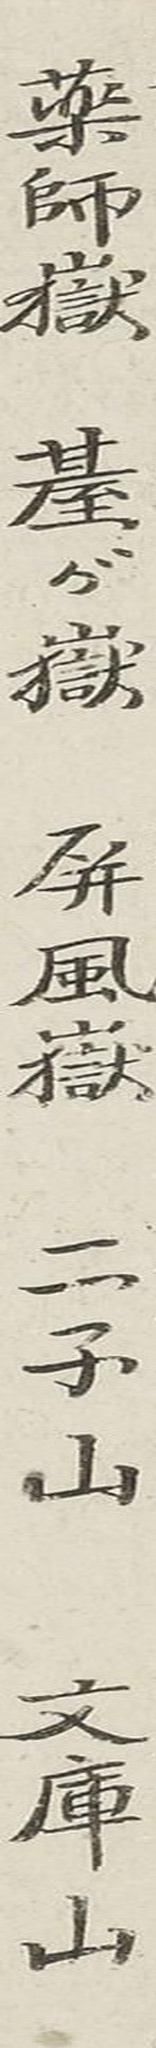薬師嶽臺が嶽屏風嶽二子山文庫山
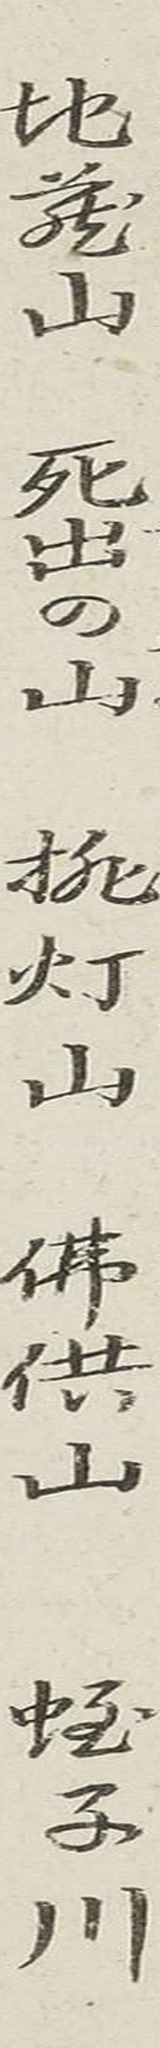地蔵山死出の山挑灯山佛供山蛭子川
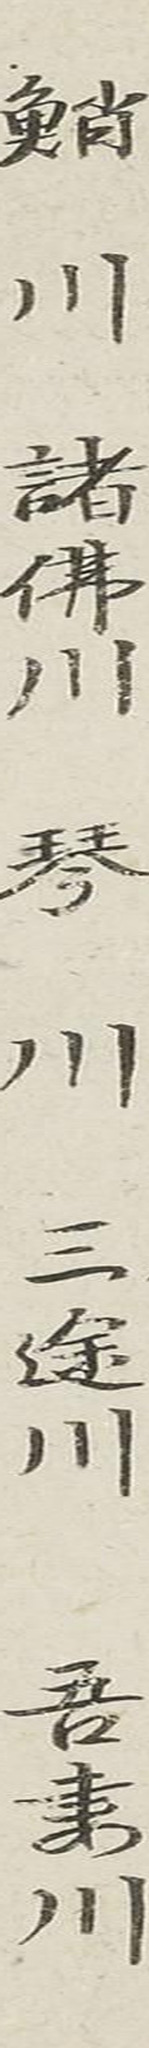蛸川諸佛川琴川三途川吾妻川
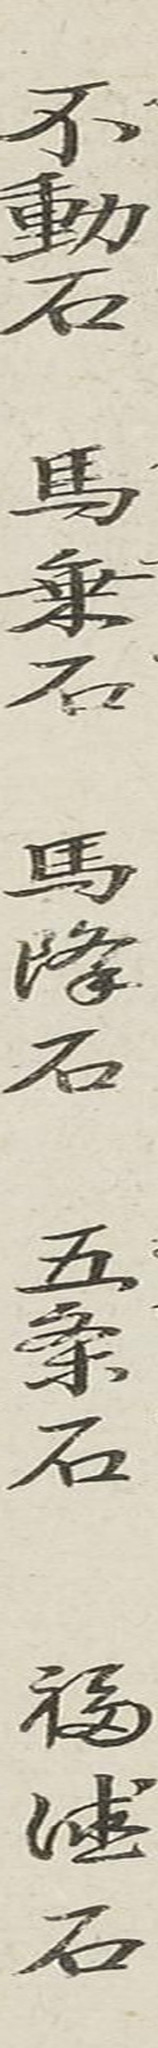不動石馬乗石馬降石五条石福徳石
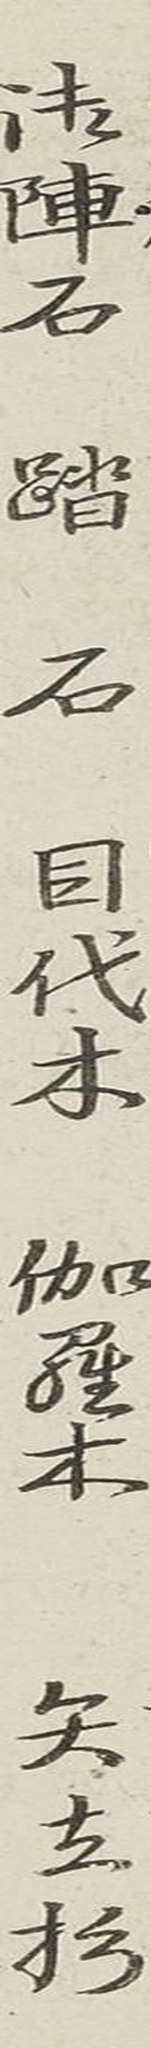御陣石踏石目代木伽羅木矢立杉
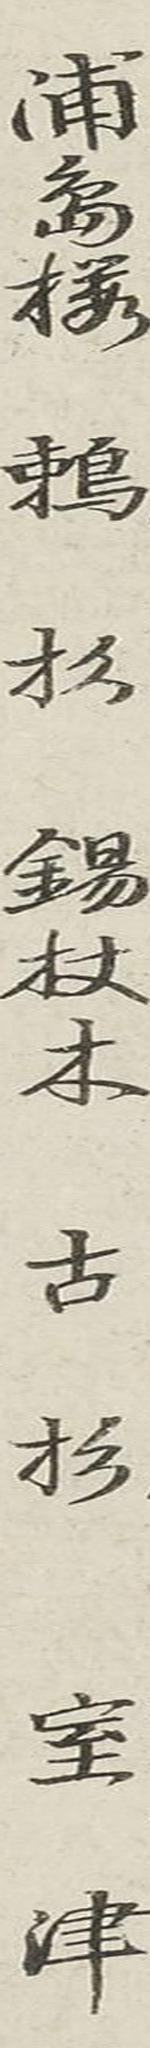浦島桜鵜杉錫杖木古杉室津

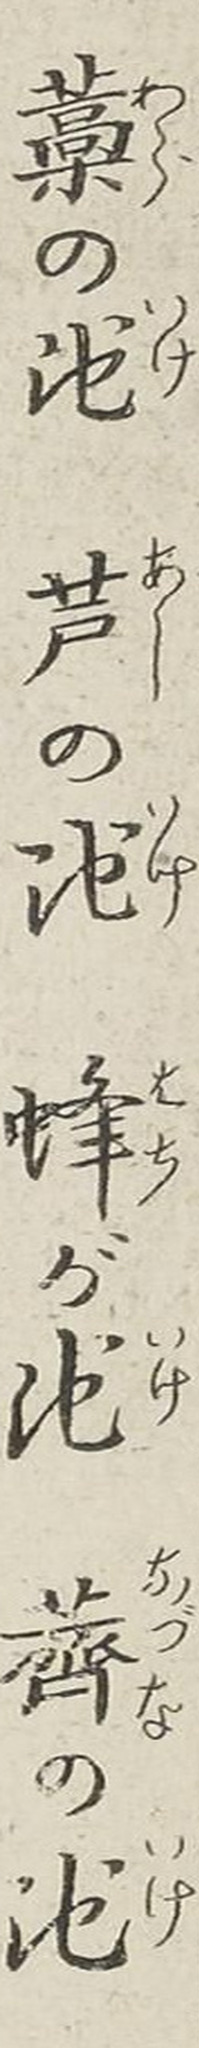藁の池芦の池蜂が池薺の池
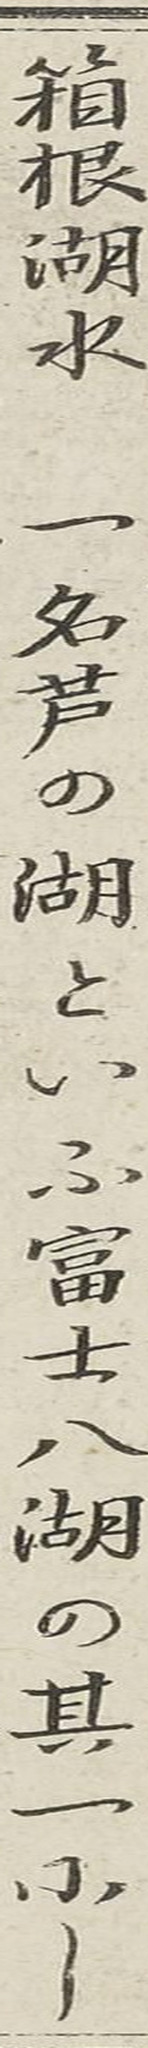箱根湖水一名芦の湖といふ富士八湖の其一にし
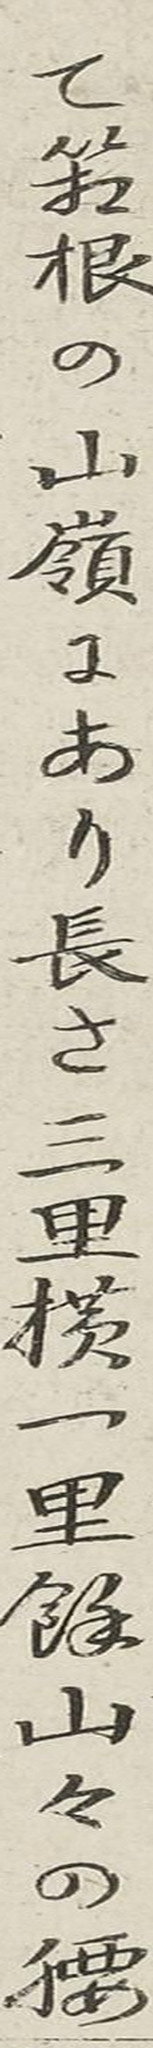て箱根の山嶺にあり長さ三里横一里餘山々の腰
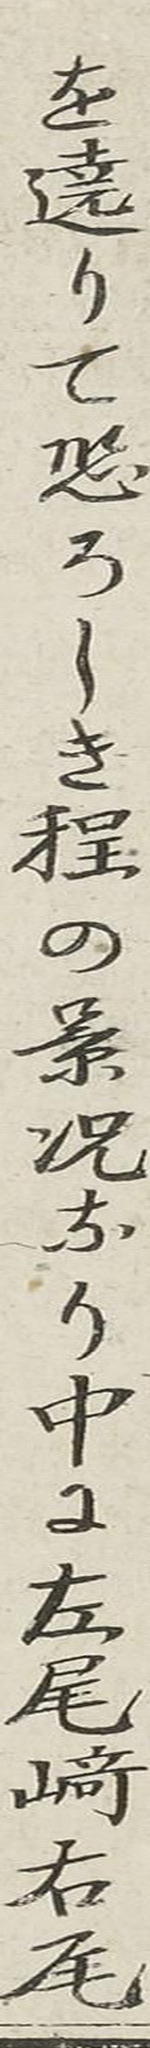を遶りて恐ろしき程の景況なり中に左尾崎右尾
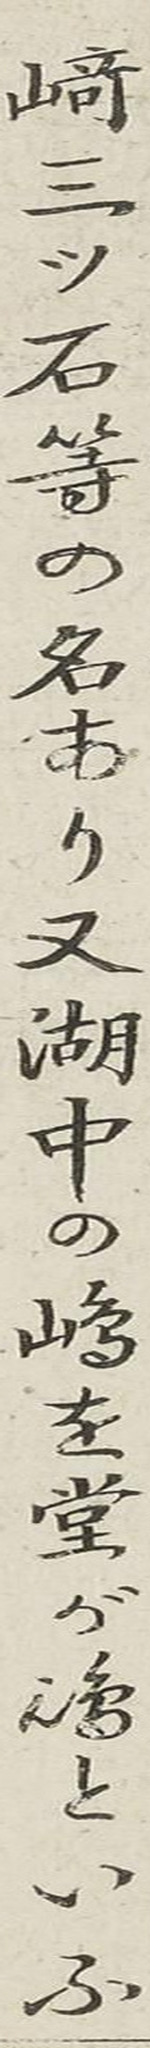崎三ッ石等の名あり又湖中の嶋を堂が嶋といふ
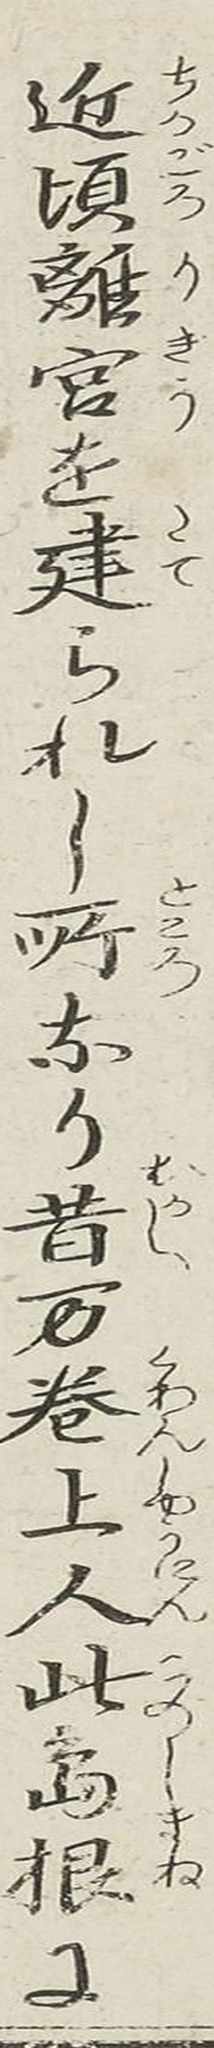近頃離宮を建られし所なり昔万巻上人此島根に
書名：箱根温泉誌　全
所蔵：東京大学地震研究所図書室 Earthquake Research Institute Library, The University of Tokyo, JAPAN
